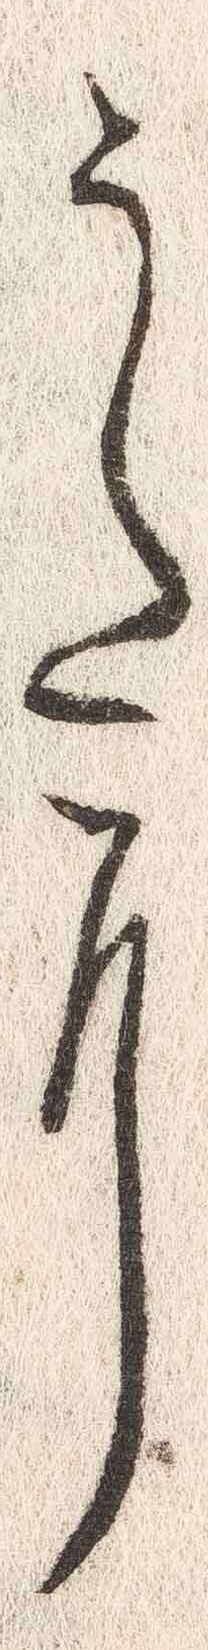うたに
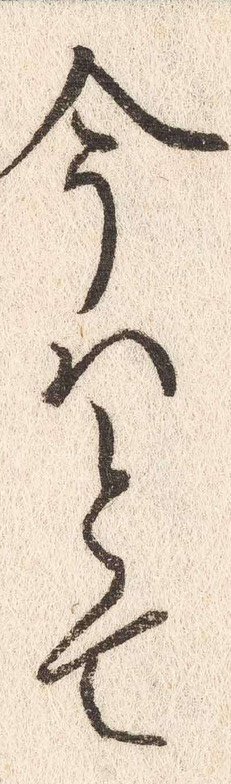今はとて
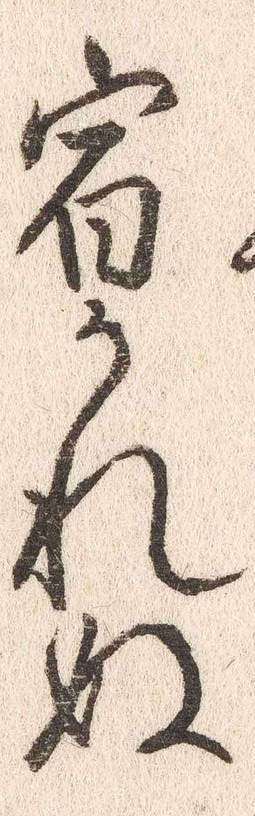宿かれぬ
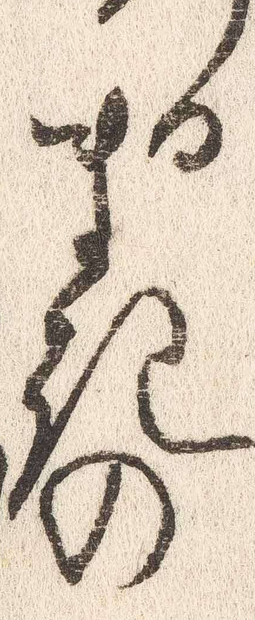まきの
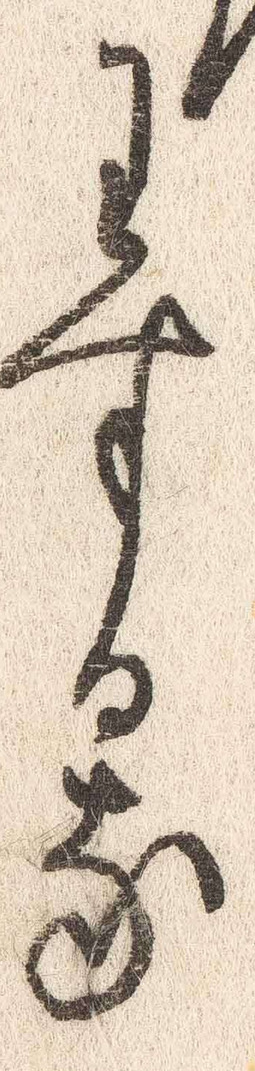わするな

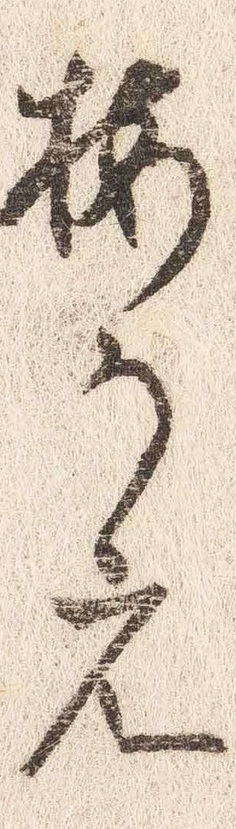梅かえ
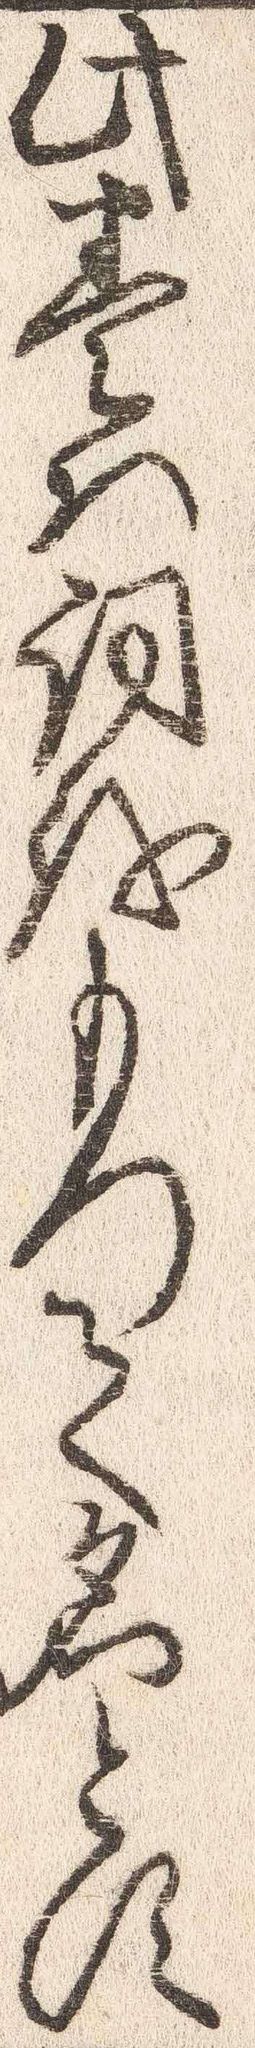此巻は詞をもつて名とす
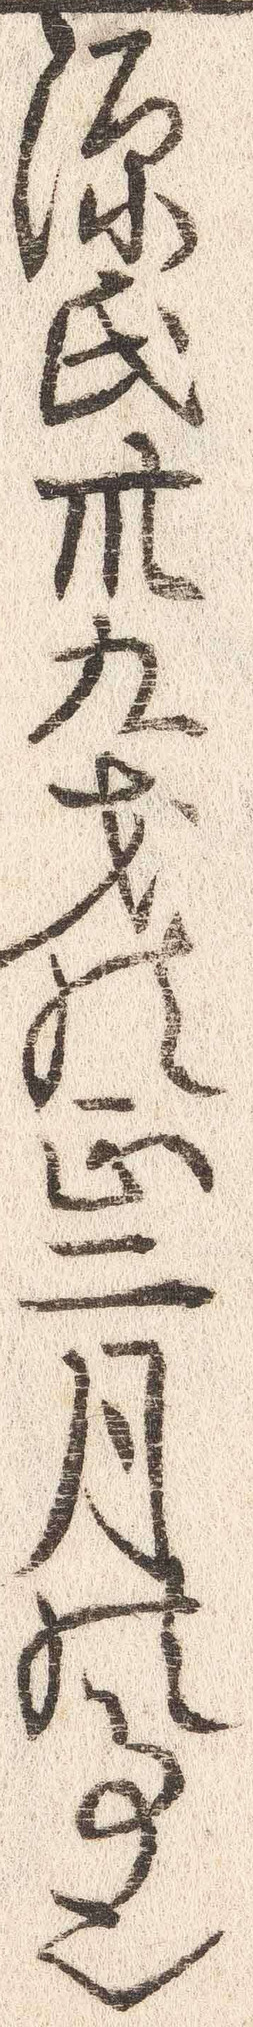源氏卅九才の正二月の事也
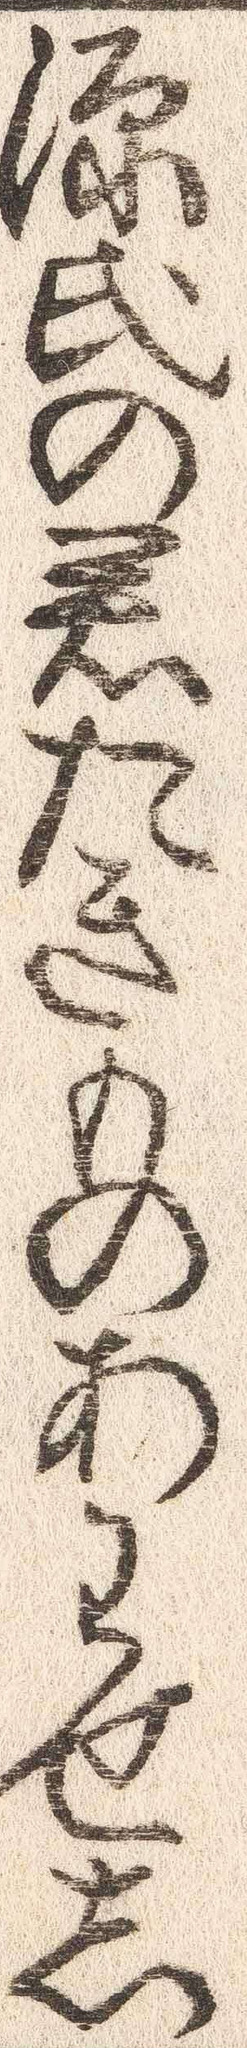源氏の君たきものあわせし
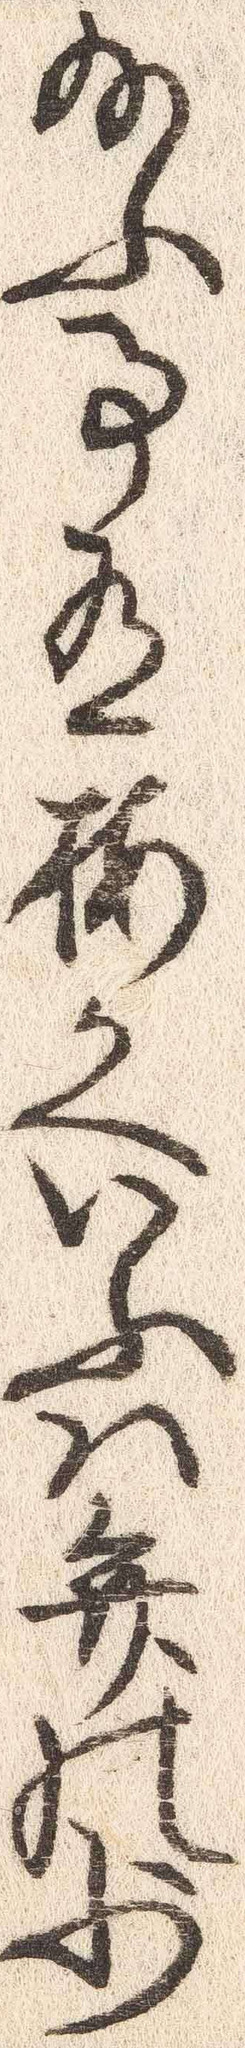給ふ事有梅かへいふは弁の少
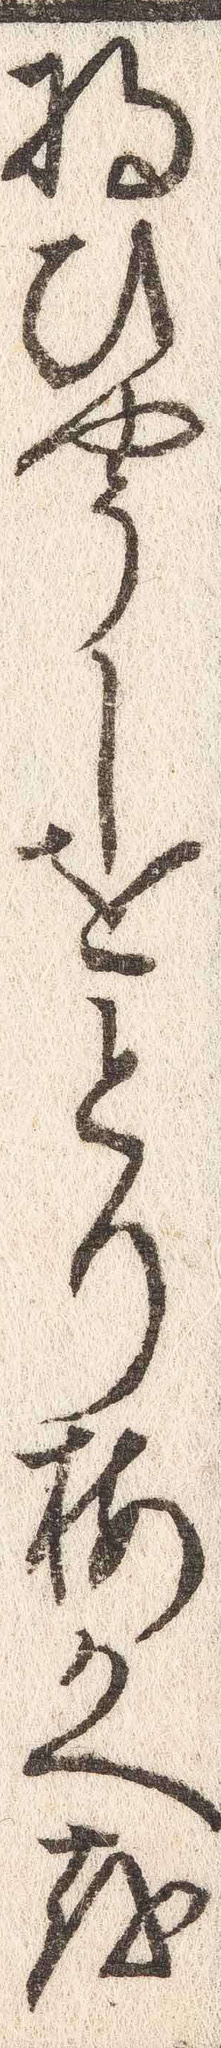将ひやうしをとり梅かへを
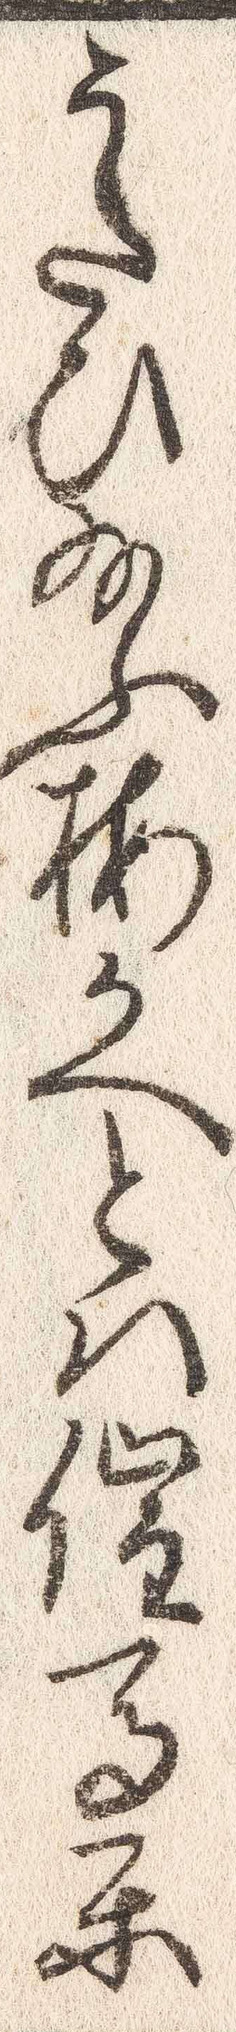うたひ給ふ梅かへとは催馬楽
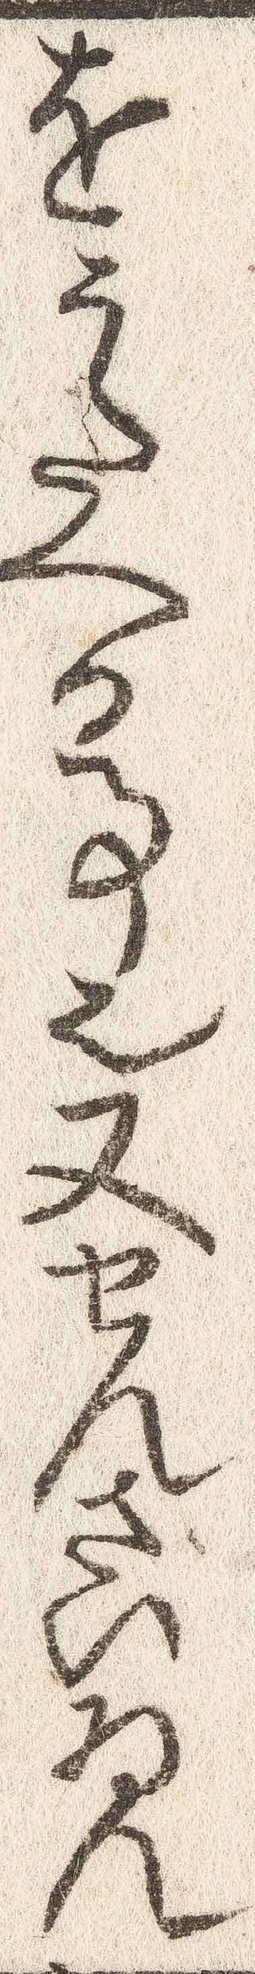をうたへる事也又せんさいゐん
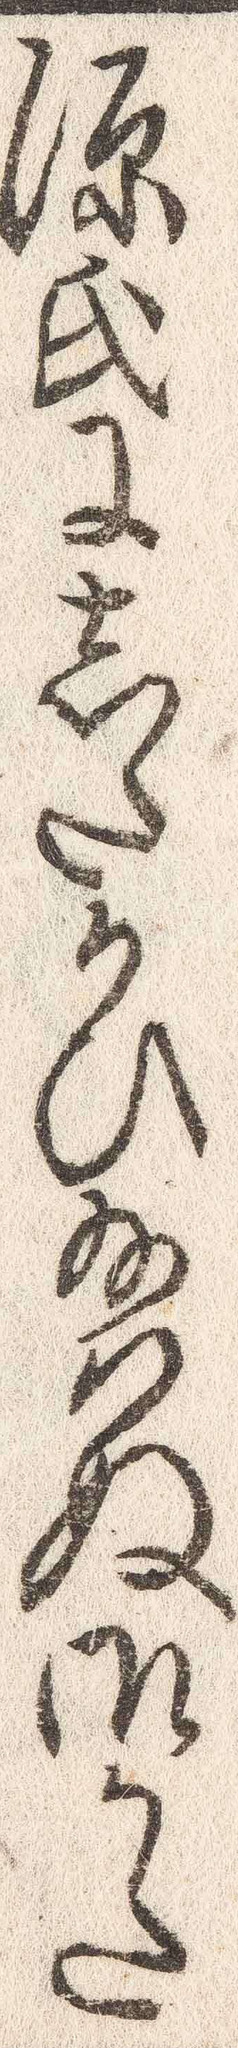源氏にしたかひ給はぬ御かた
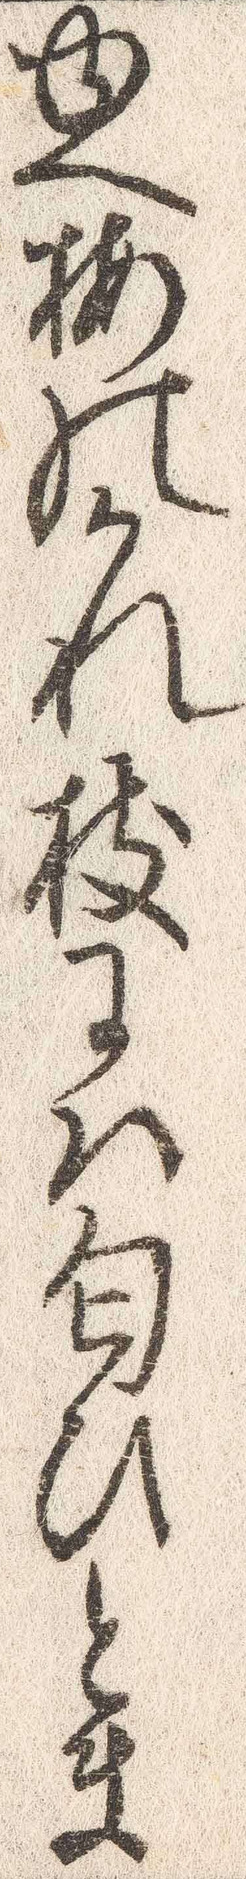ゆへ梅のかれ枝には匂ひとま

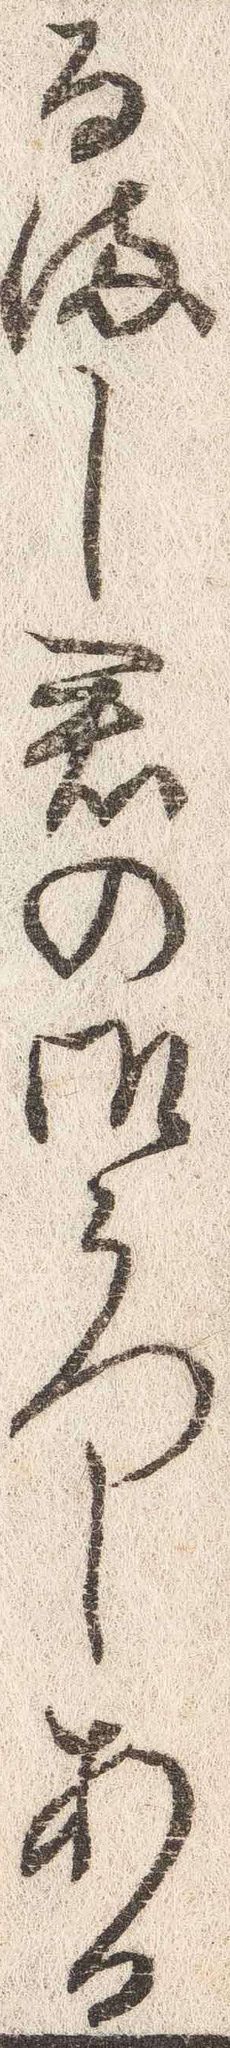るまし君の御うつしある
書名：源氏物語
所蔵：東京学芸大学附属図書館 国文学研究資料館
